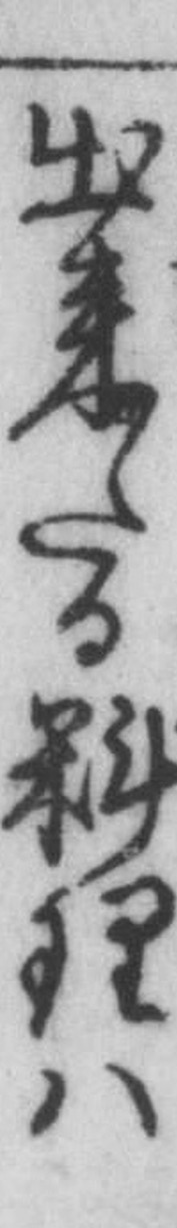出来たる料理ハ
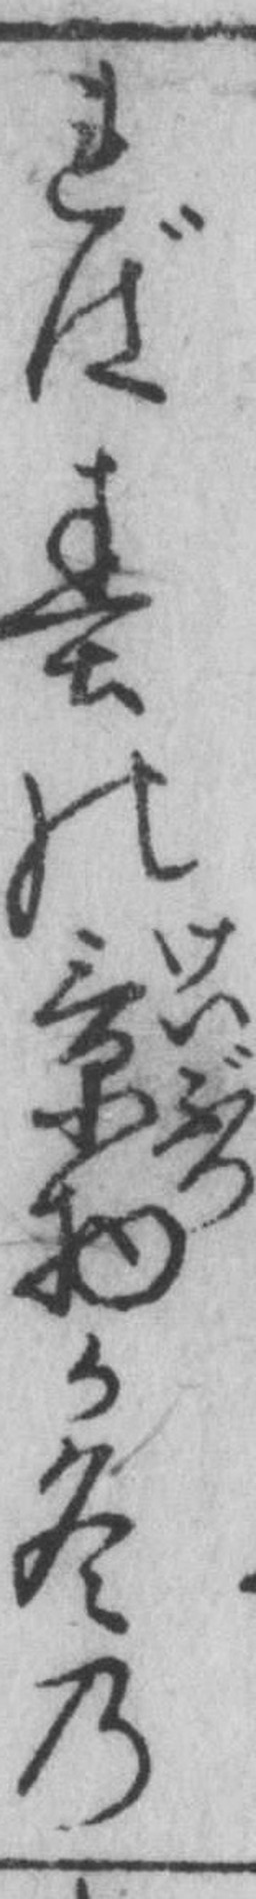れバ春の景物か冬の
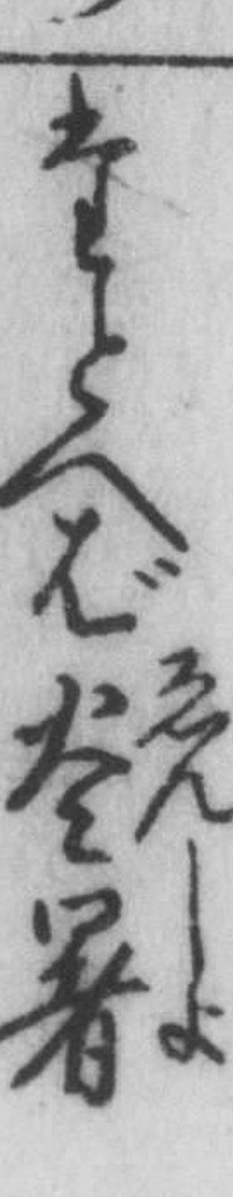たとへば炎暑
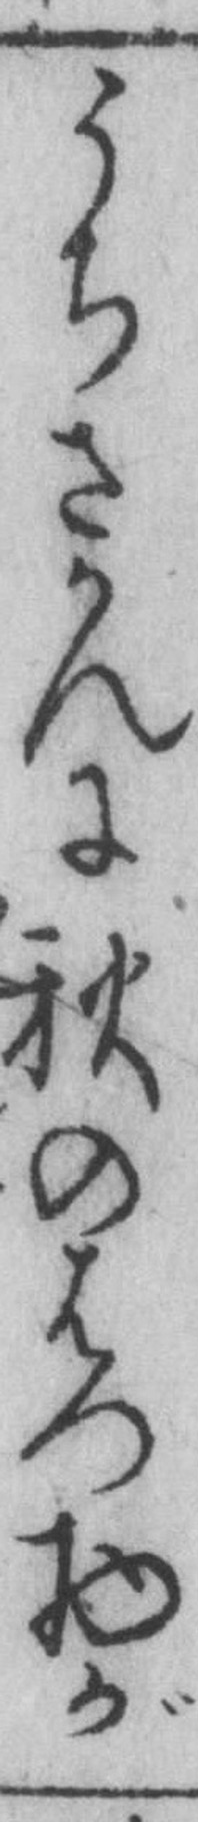うちさかんに秋のはつ物が
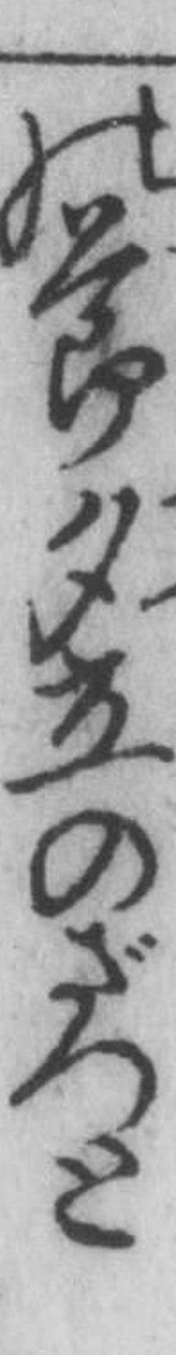の節夕立のざつと
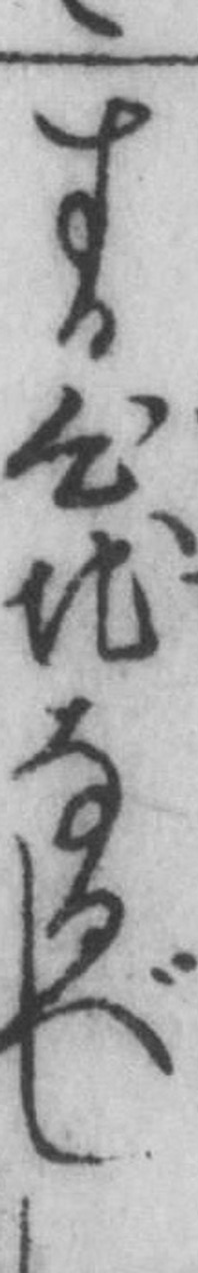する心地なるべし
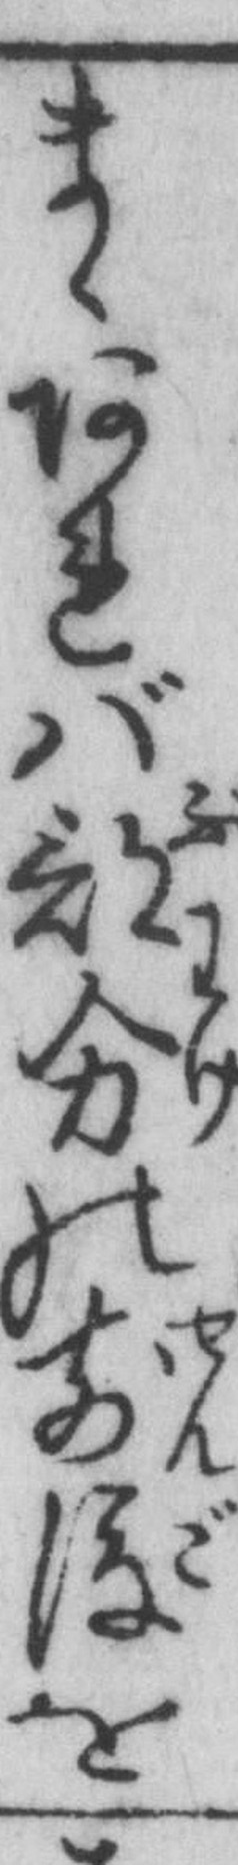まゝあれバ部分の前後を
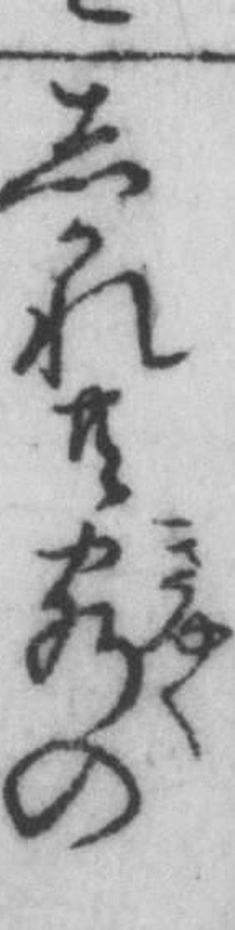しかれ共客の
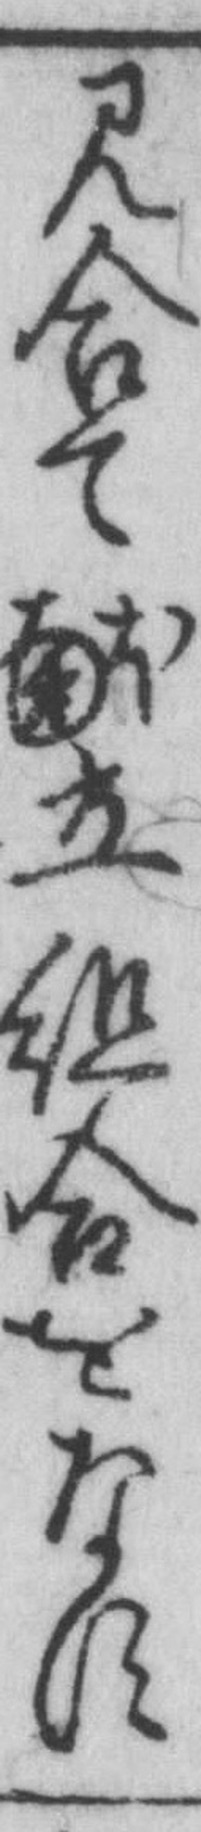見合て献立組合をなす
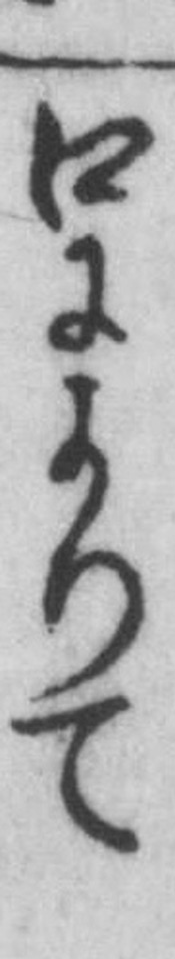口によりて
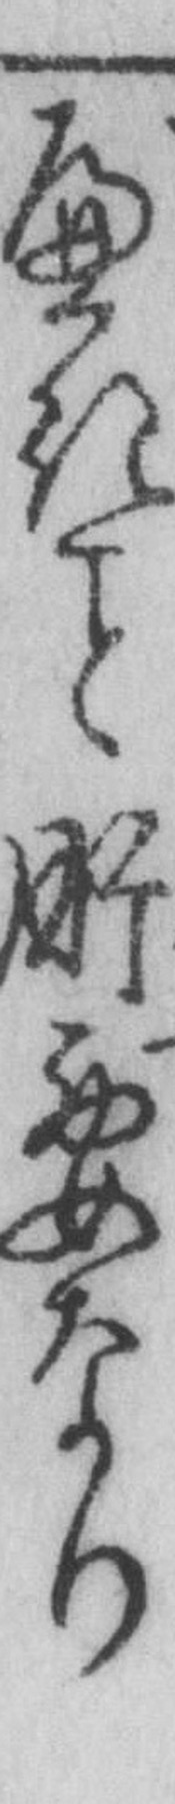べきと肝要なり
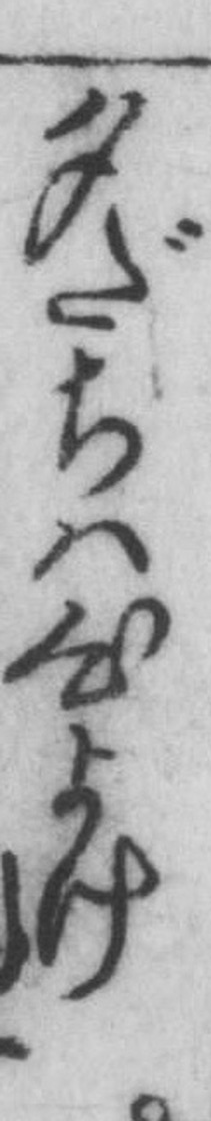夕だちハひよけれ
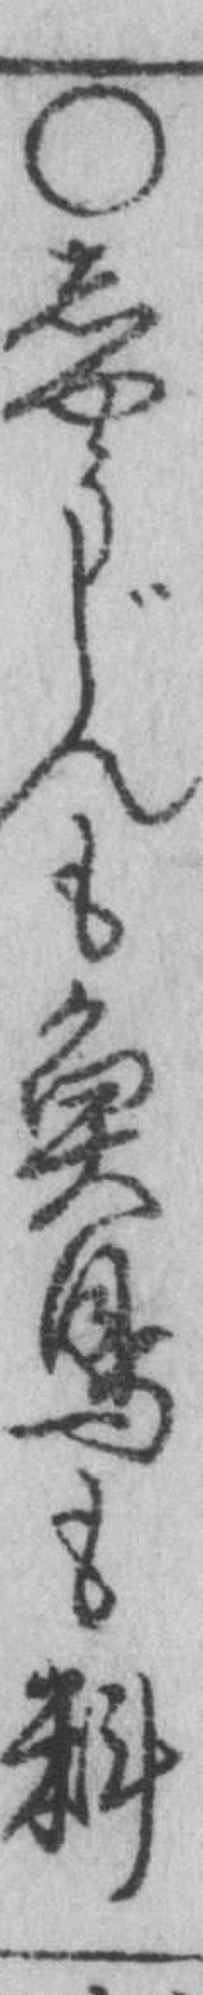〇しやうじんも魚鳥も料
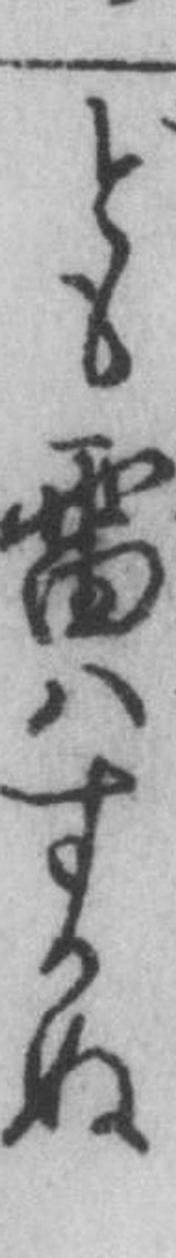ども雷葉すかぬ
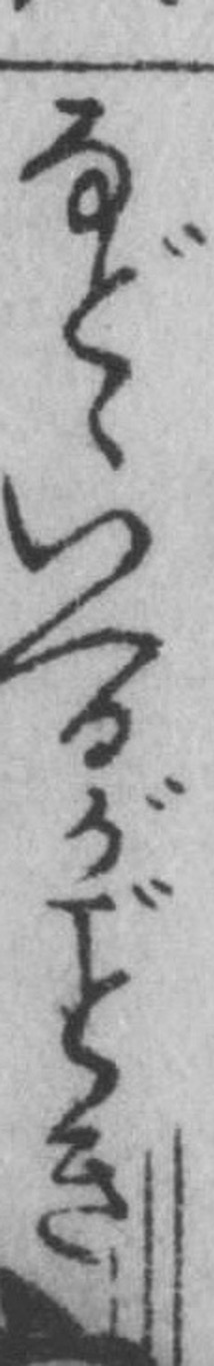などゝいへるがごとき
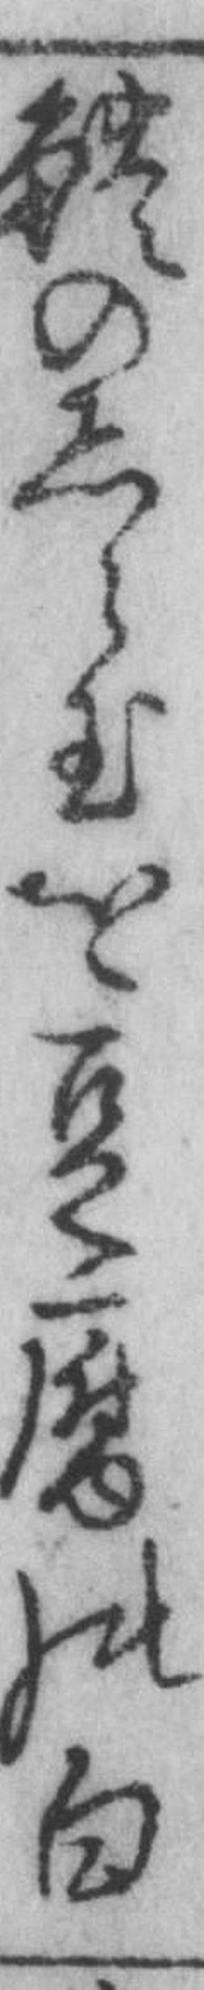のしら玉を豆腐の白
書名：料理献立抄
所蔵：大阪府立大学学術情報センター 国文学研究資料館
